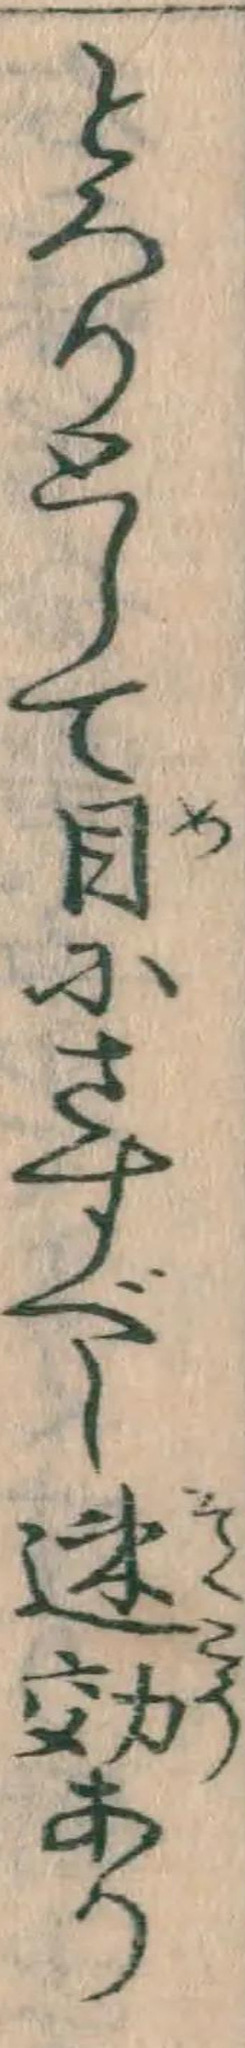とろりとして目にさすべし速効あり
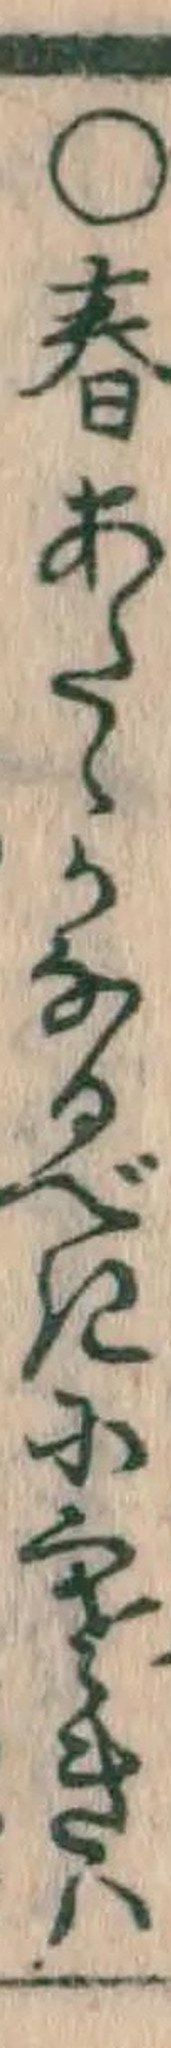○春あたゝかなるべきに寒きは
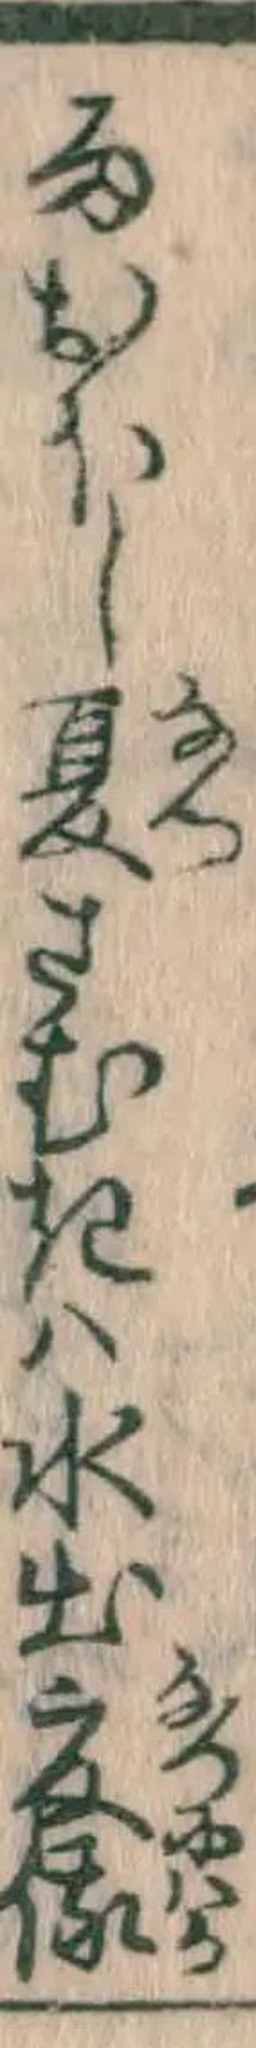雨おほし夏さむきは水出夏俄
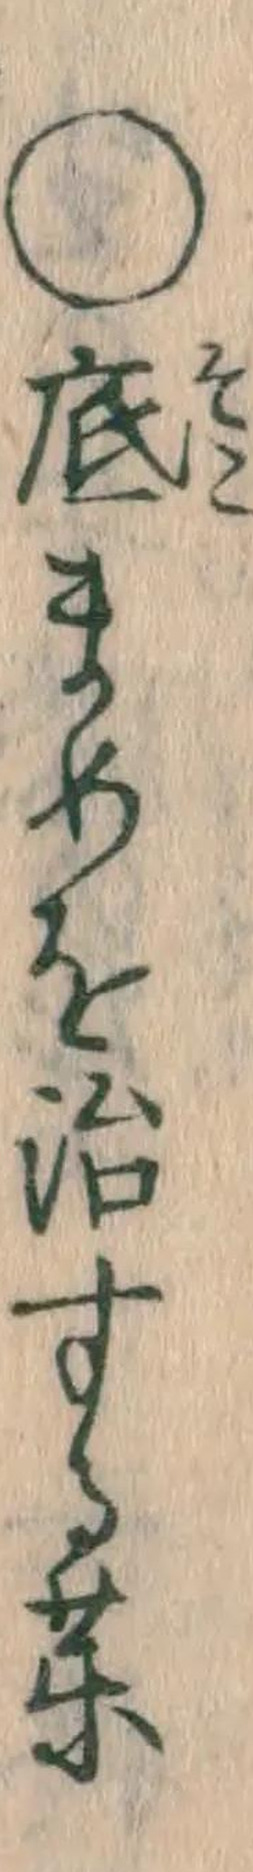○底まめを治する薬
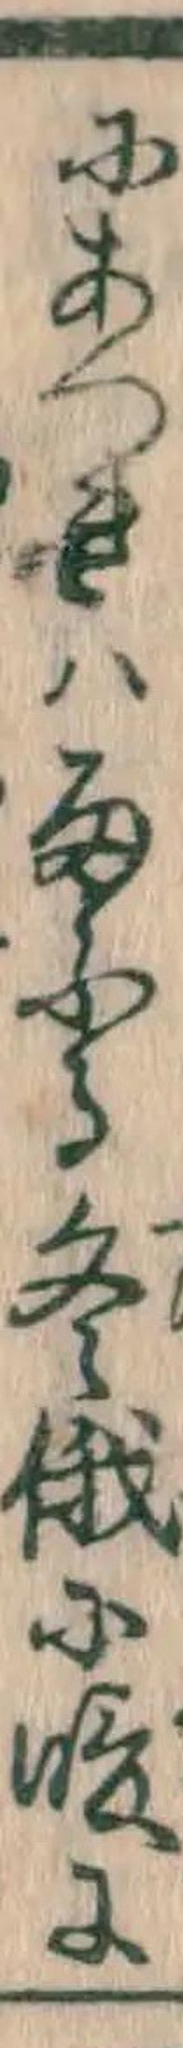にあつきは雨ふる冬俄に暖に
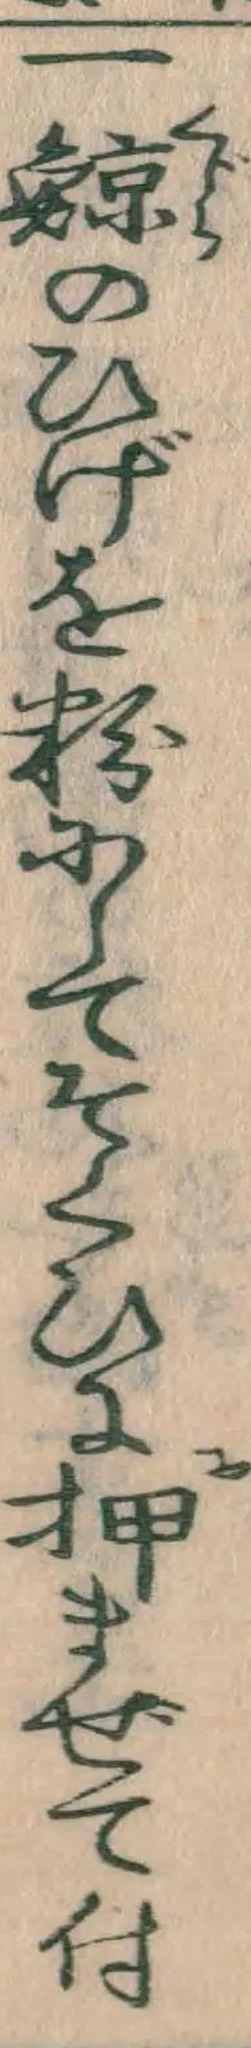一鯨のひげを粉にしてそくひに押まぜて付
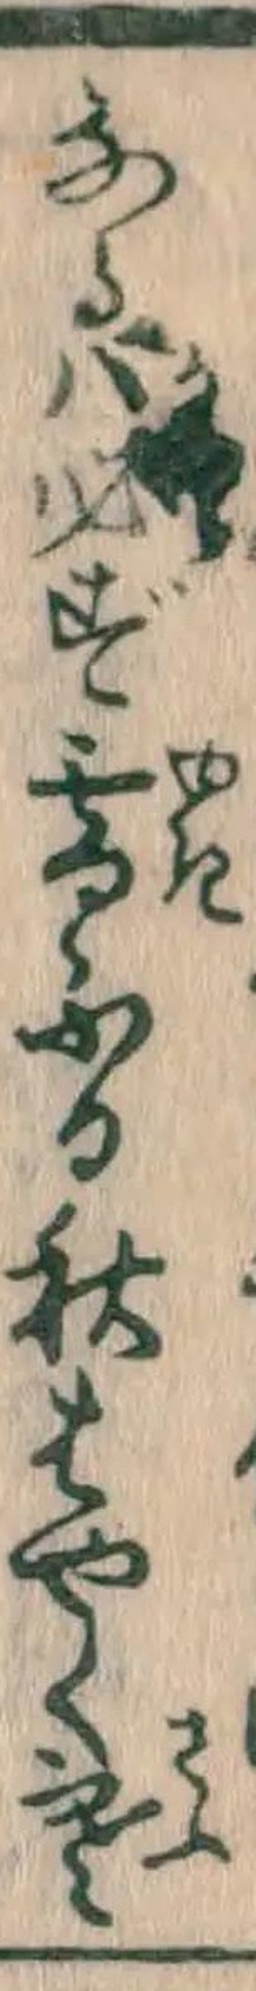なるは必ず雪ふる秋はやく寒
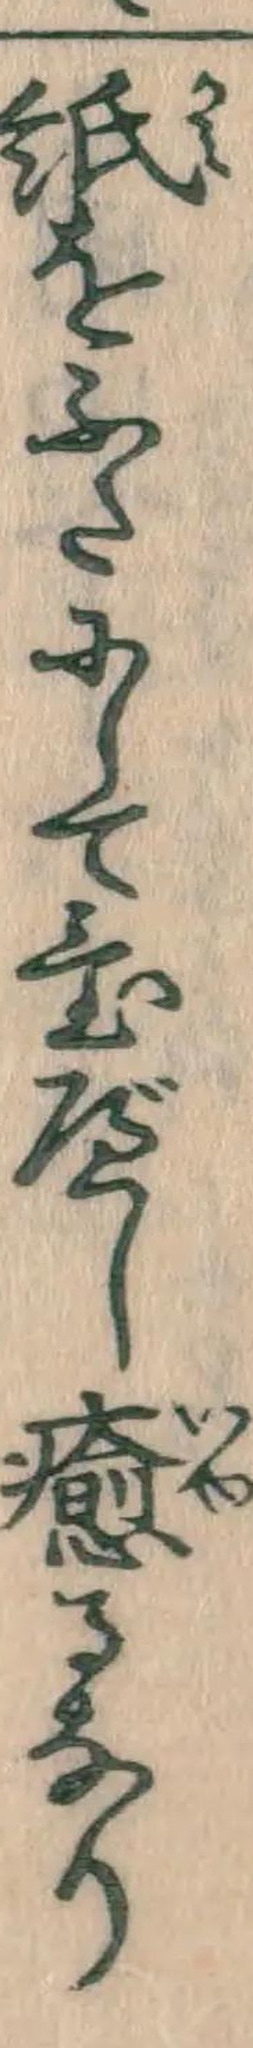紙をふたにして置べし癒るなり
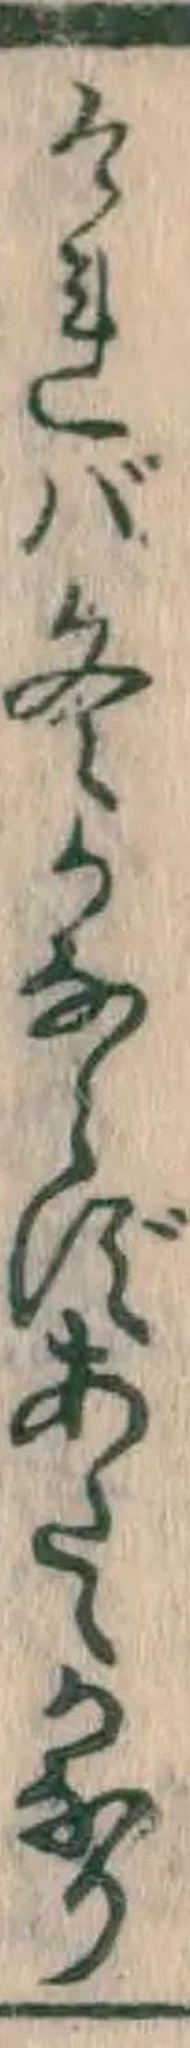ければ冬かならずあたゝかなり
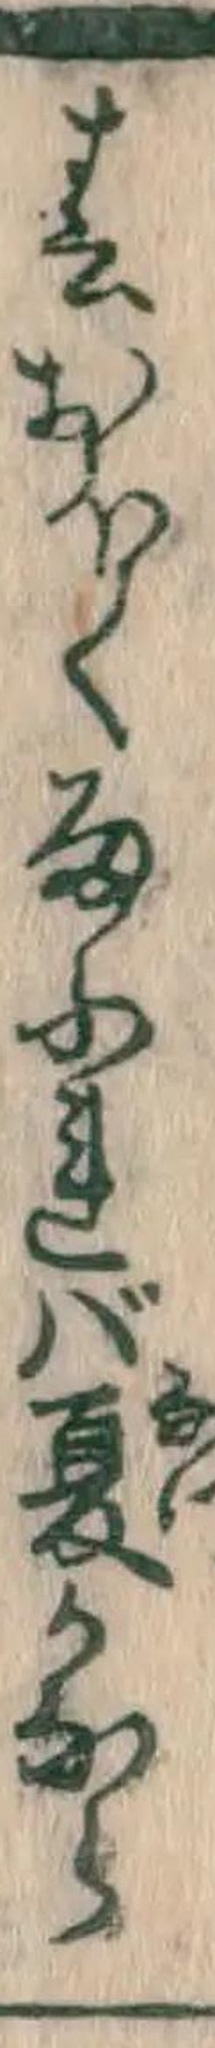春おほく雨ふれば夏かなら
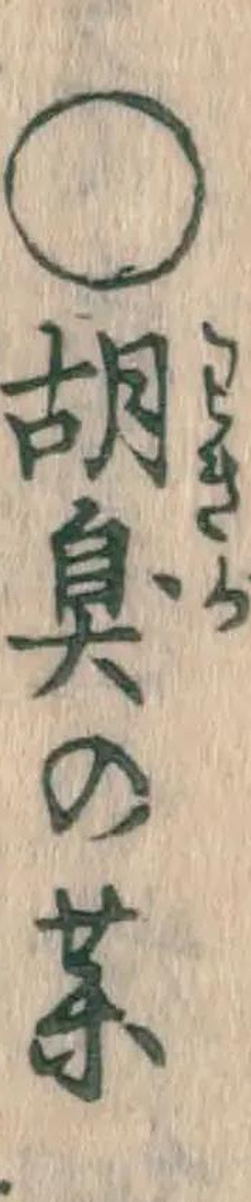○胡臭の薬
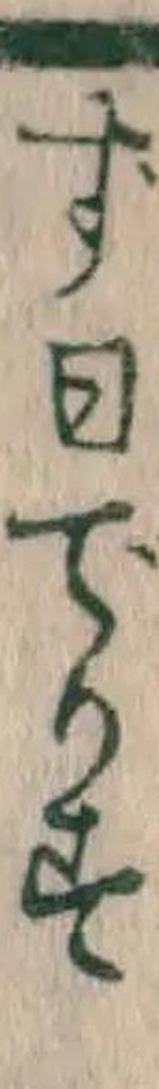ず日でりす
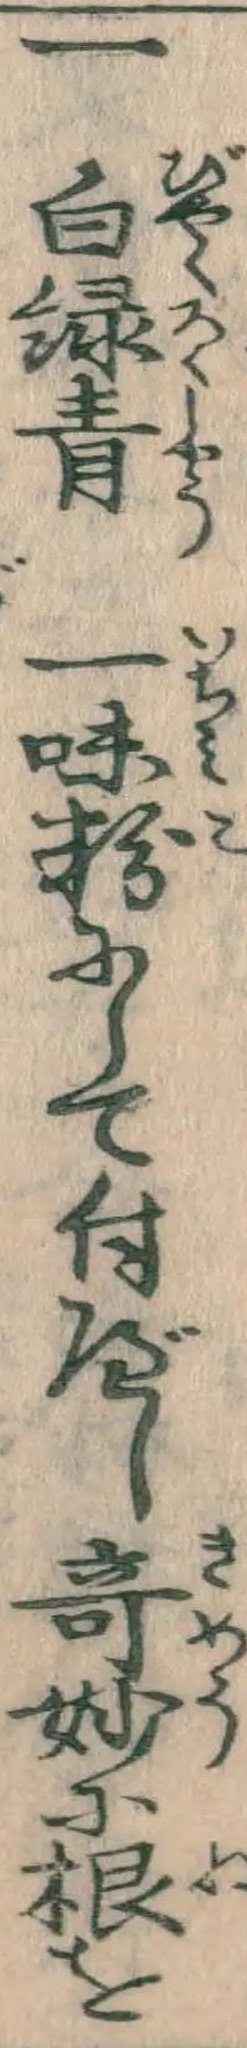一白緑青一味粉にして付べし奇妙に根を
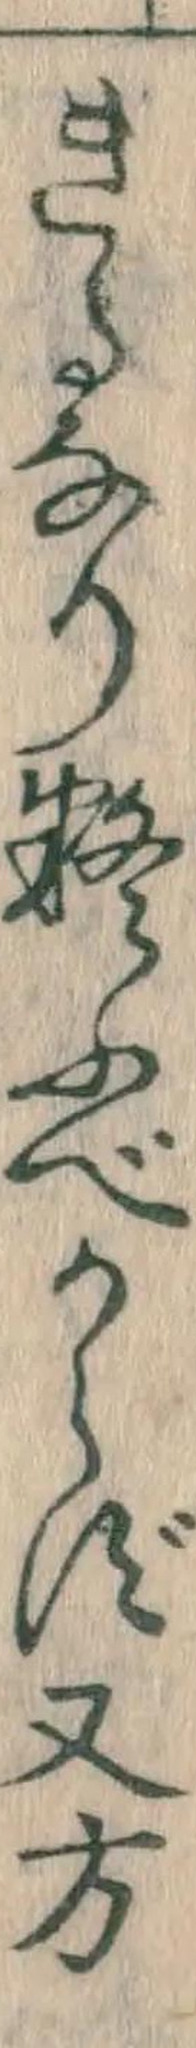きるなり疑ふべからず又方
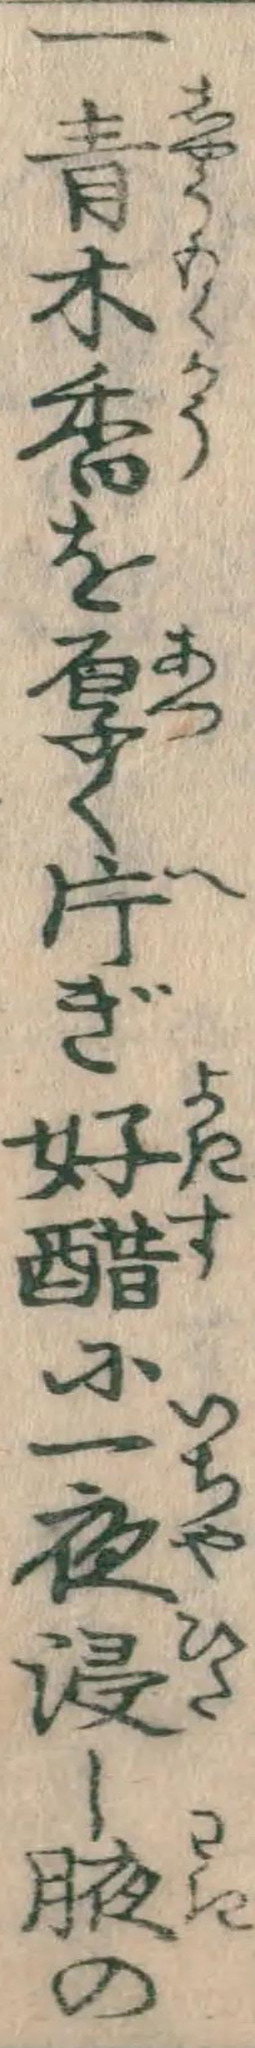一青木香を厚く片ぎ好醋に一夜浸し腋の
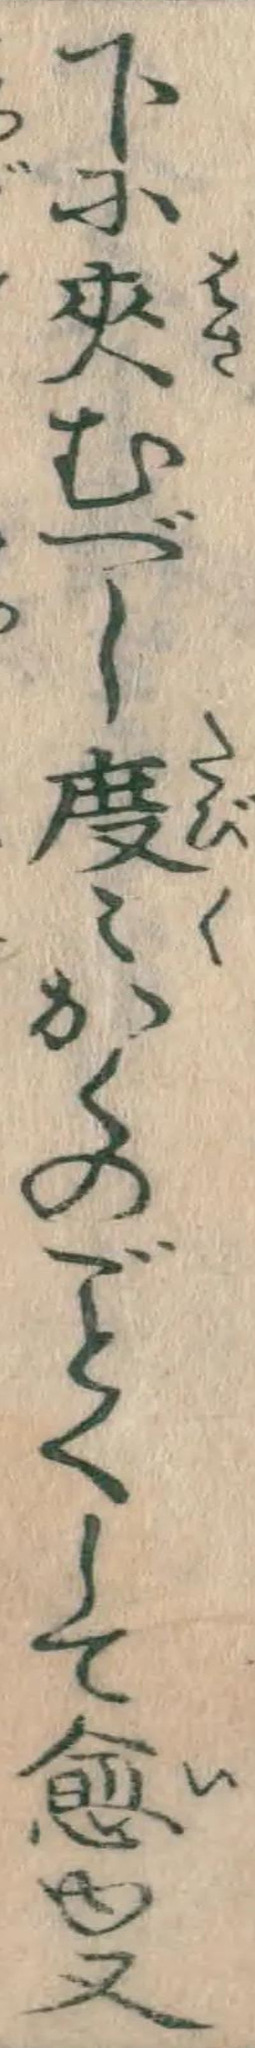下に夾むべし度々かくのごとくして愈ゆ又
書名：広益秘事大全 3巻. [4]
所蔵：国立国会図書館 National Diet Library, JAPAN
